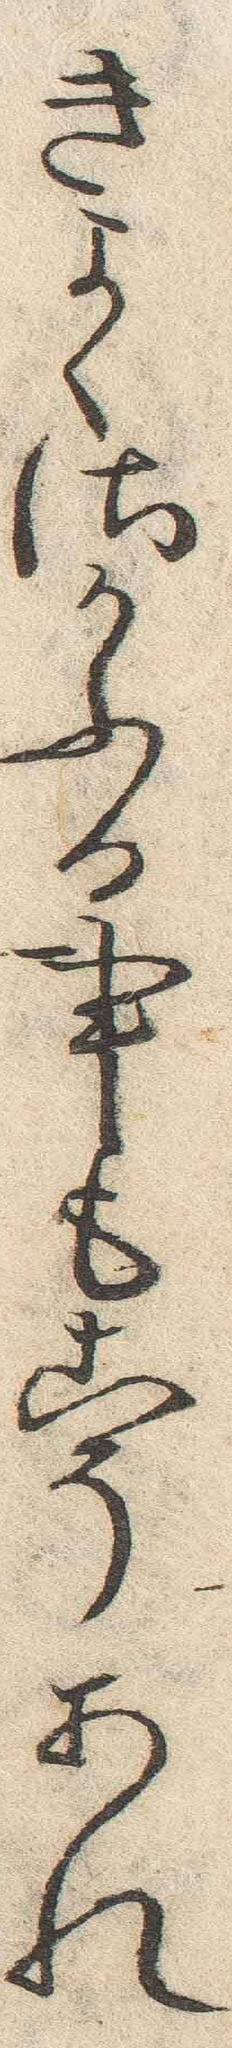きよくさかふる事もこそあれ
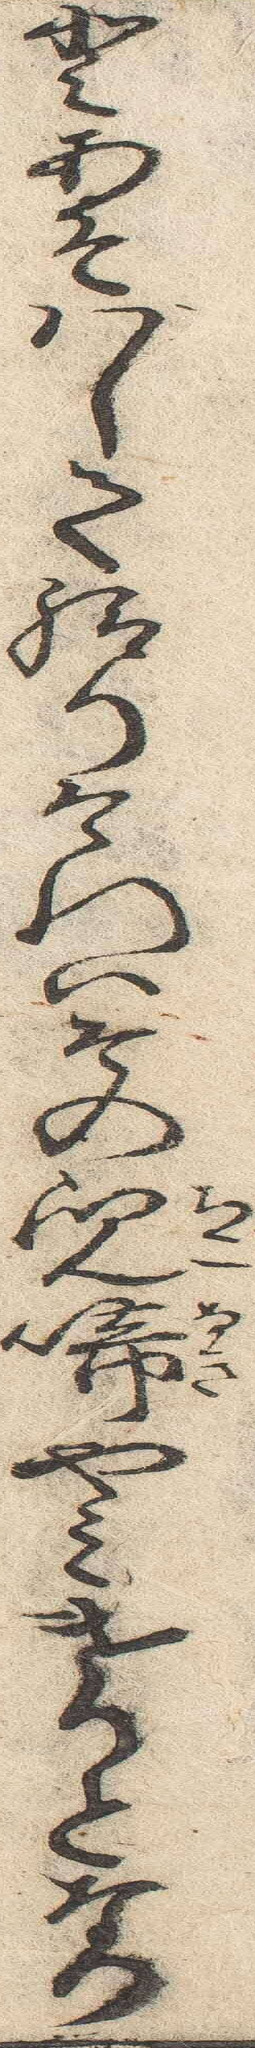とあそはして給りけれはその児啼やみけりとなり
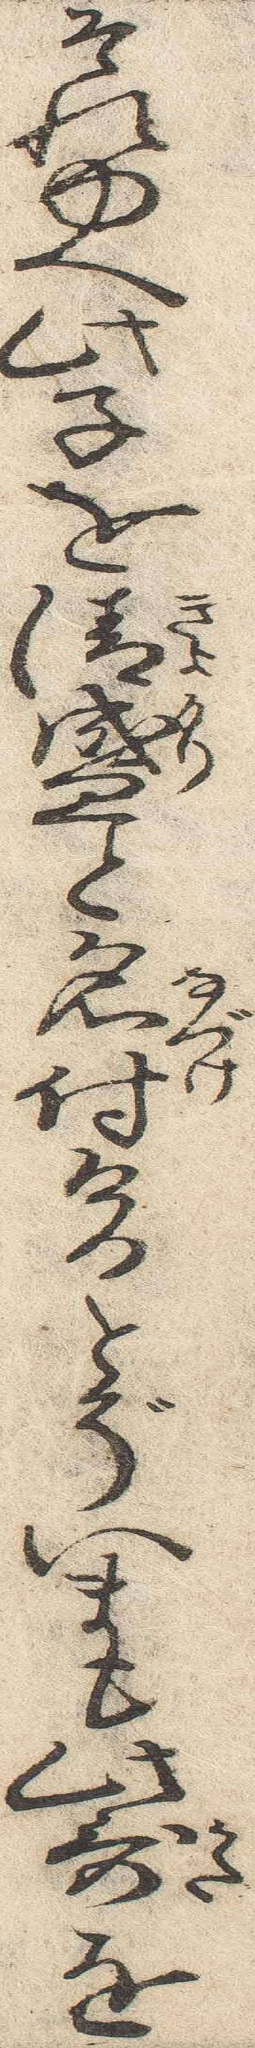それゆへ此子を清盛と名付けるとぞいまも此哥を
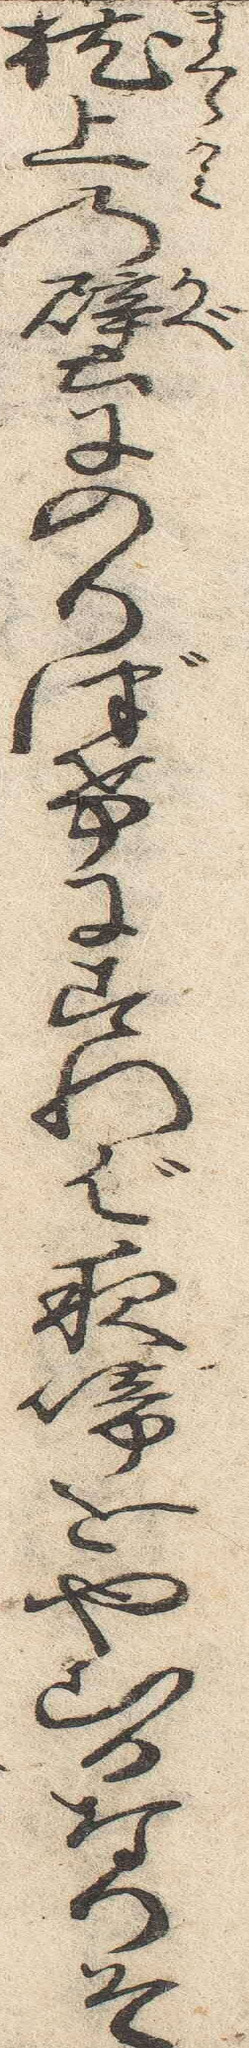枕上の壁にのりづけにすれば夜啼をやむるなりそ
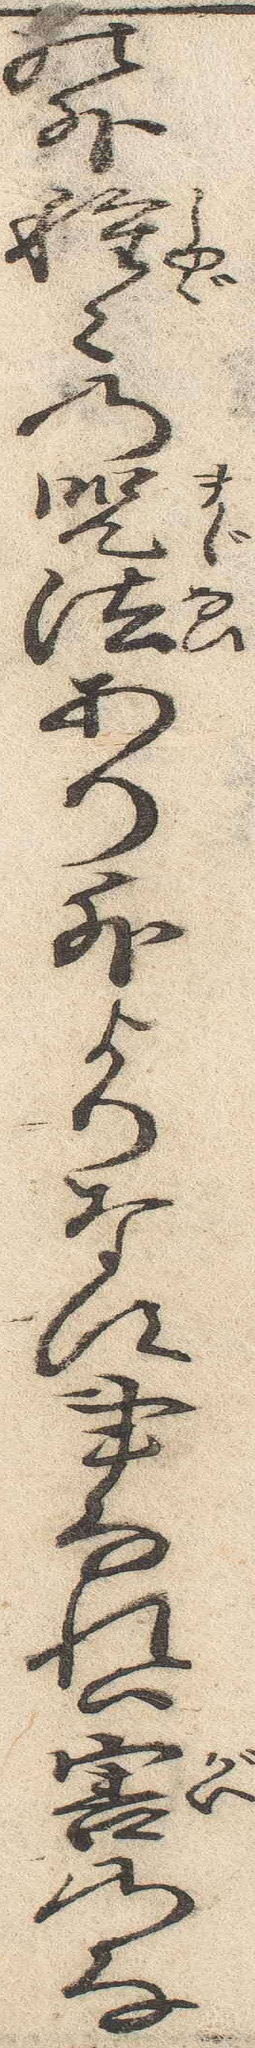の外種々の呪法あり外よりなす事なれは害のな
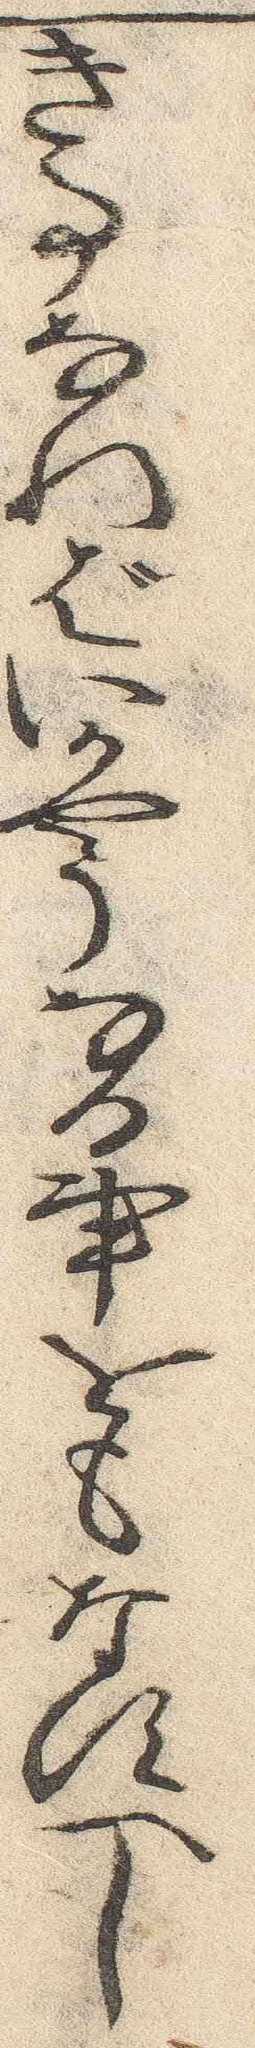き事なればいかやうなる事をもなすへし
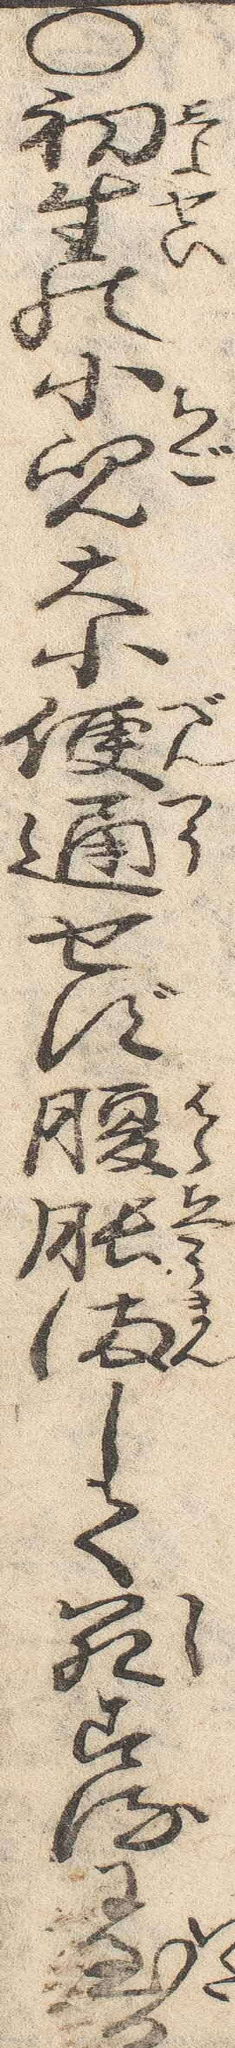○初生の小児大小便通せず腹脹満して死するに至る
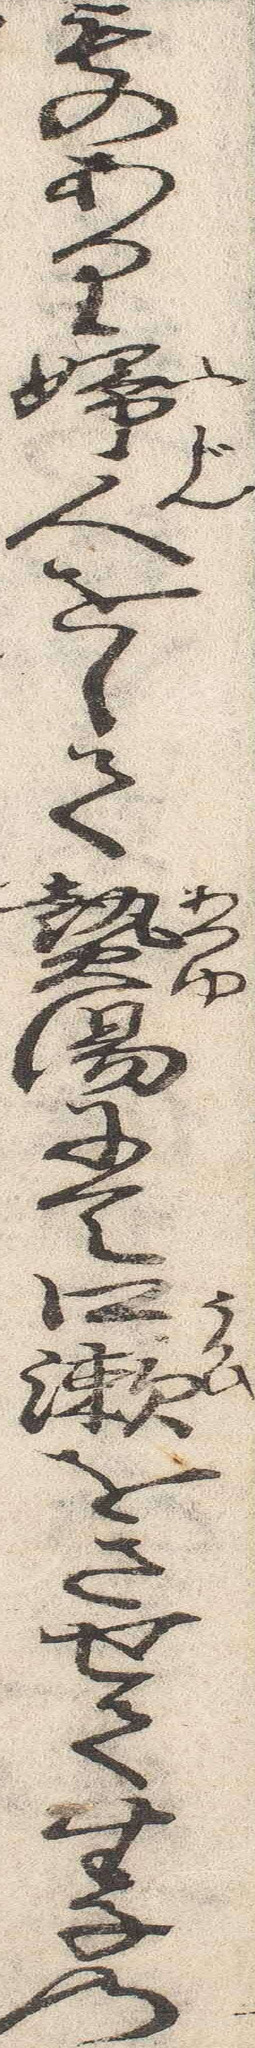ものあり婦人をして熱湯にて口漱をさせて生子の
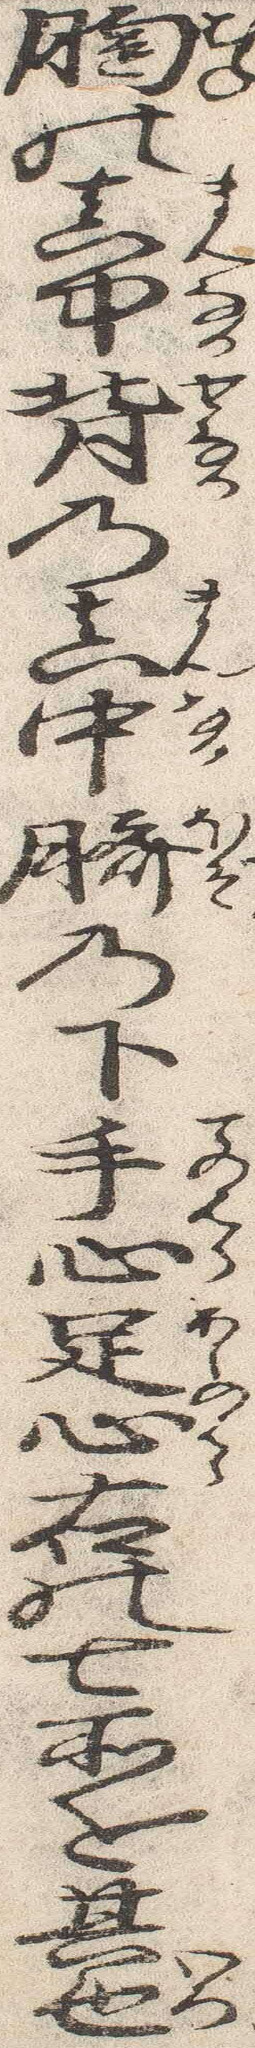胸の真中背の真中臍の下手心足心右の七所を其色
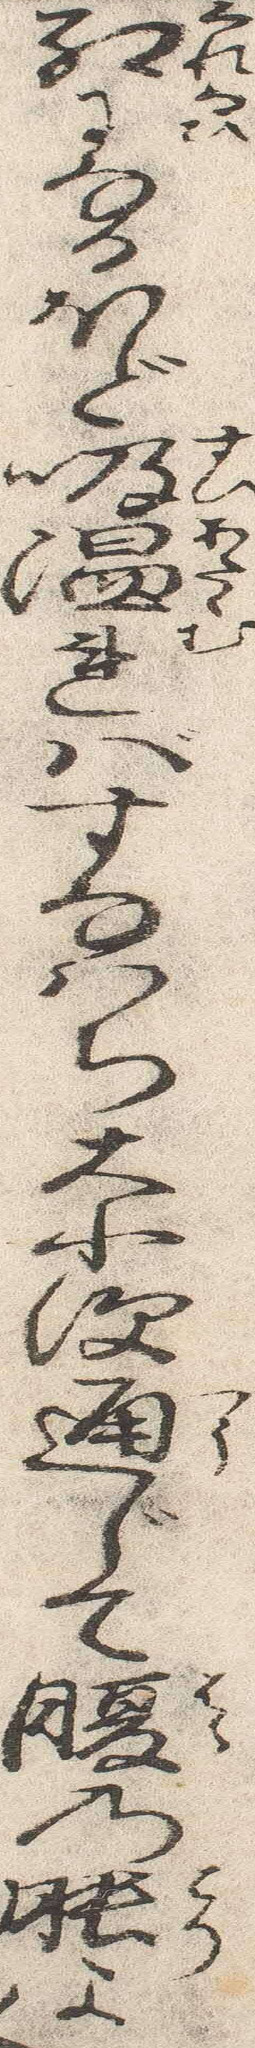紅になるほど吸温ればすなはち大小便通じて腹の脹よく
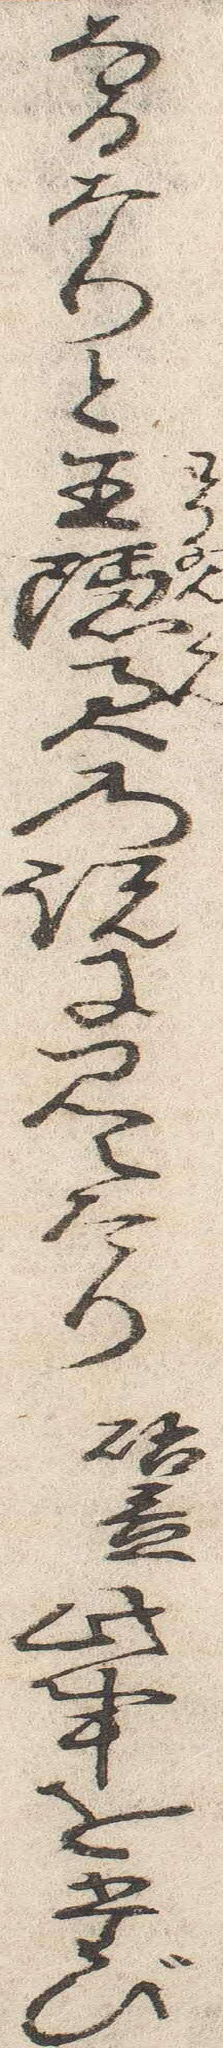なるなりと王隠君の説に見えたり啓益此事をたび
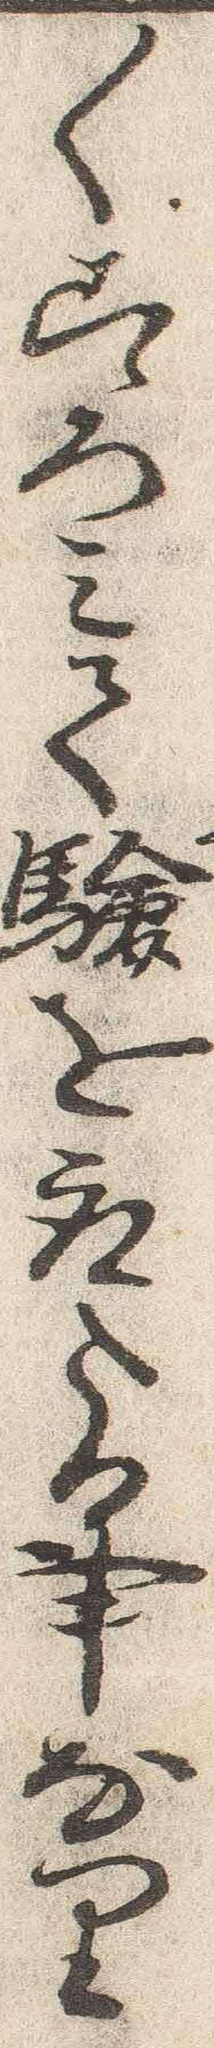〳〵こゝろみて験を取たる事なり
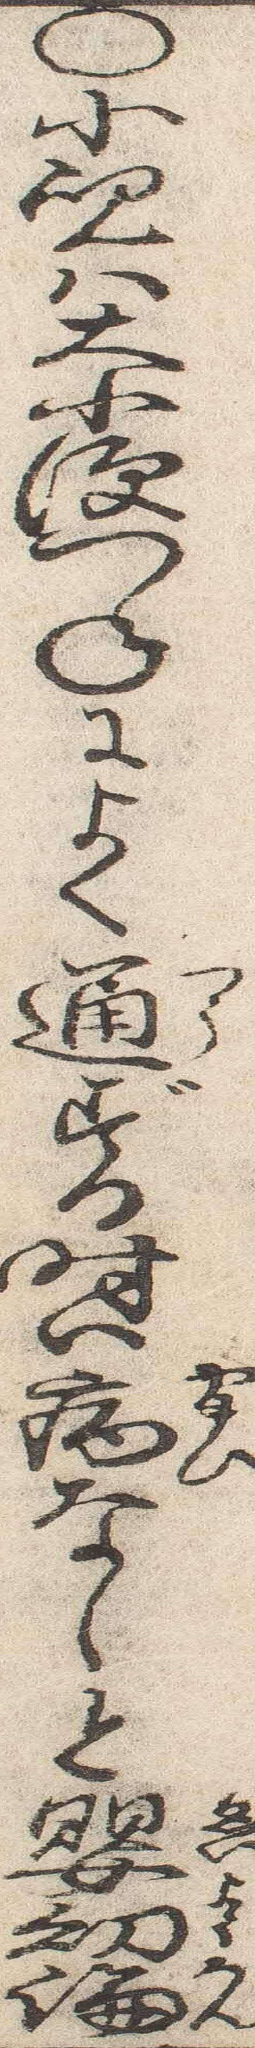○小児は大小便つねによく通ずる時は病なしと嬰幼論
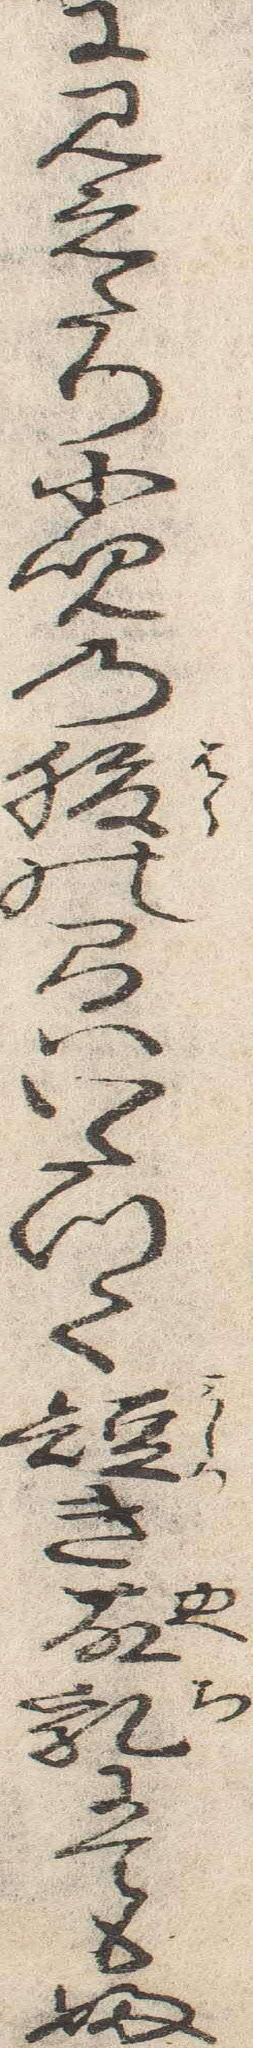に見えたり小児の腹の間はいたつて短き故乳にてもふ
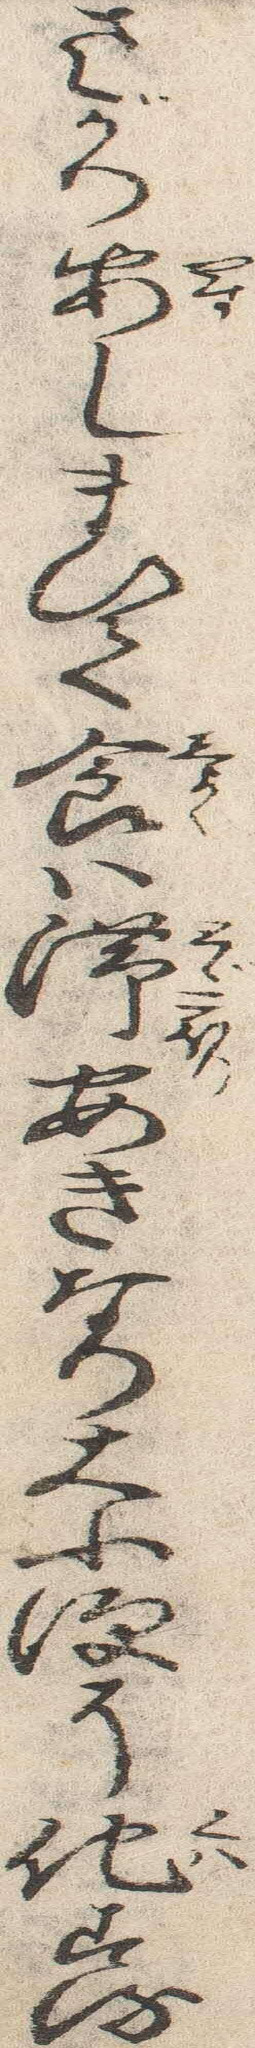さがり安しまいて食は滞安きなり大小便に化する
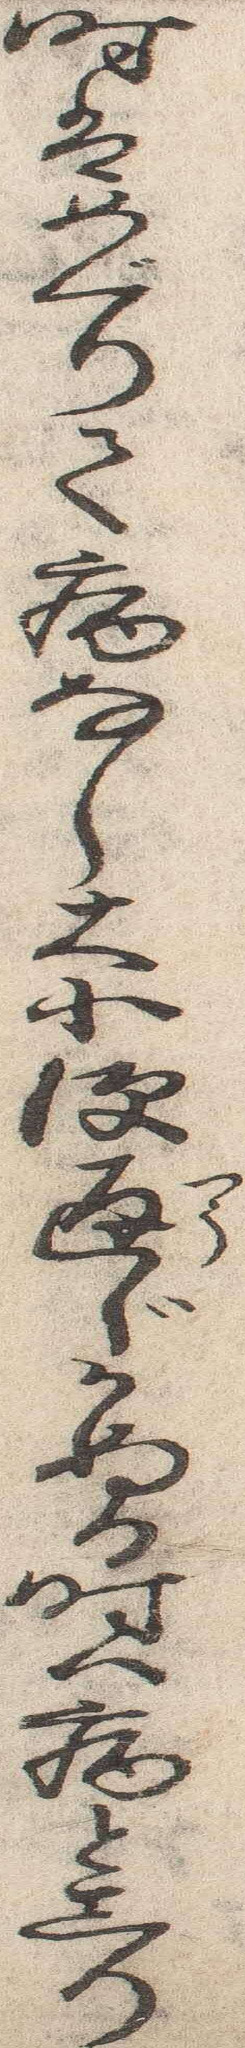時はめぐりて病なし大小便通じかぬる時は病としり
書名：小児必用養育草
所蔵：東京学芸大学附属図書館 国文学研究資料館
